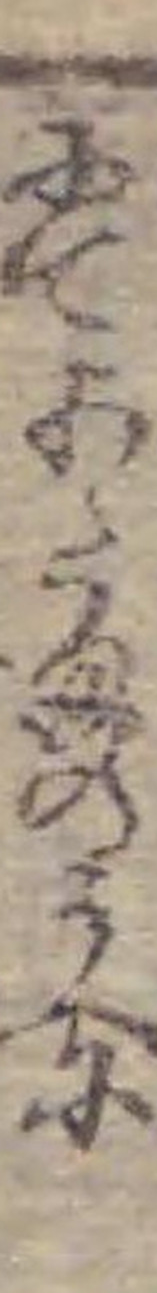にてあたまのうへに
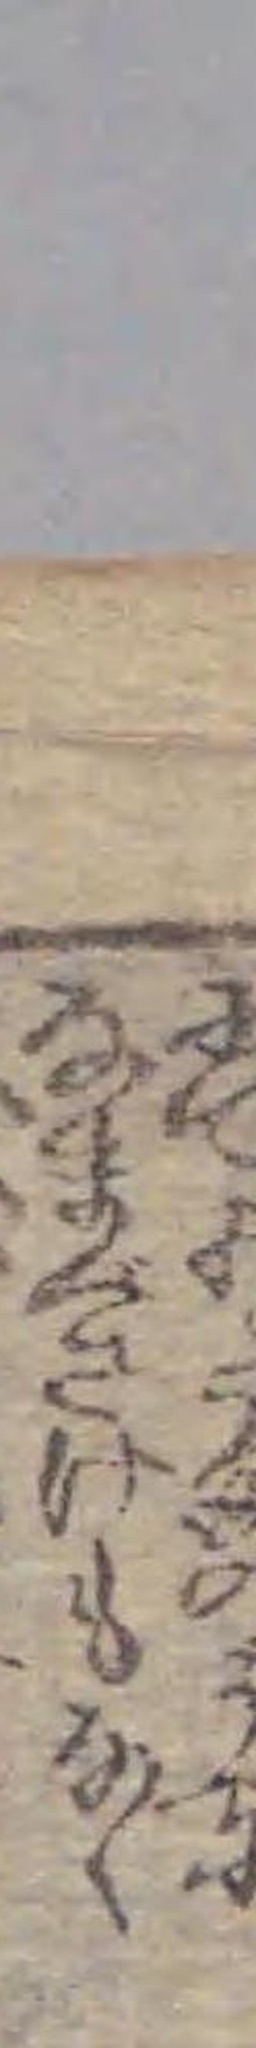なまぐさけもなく
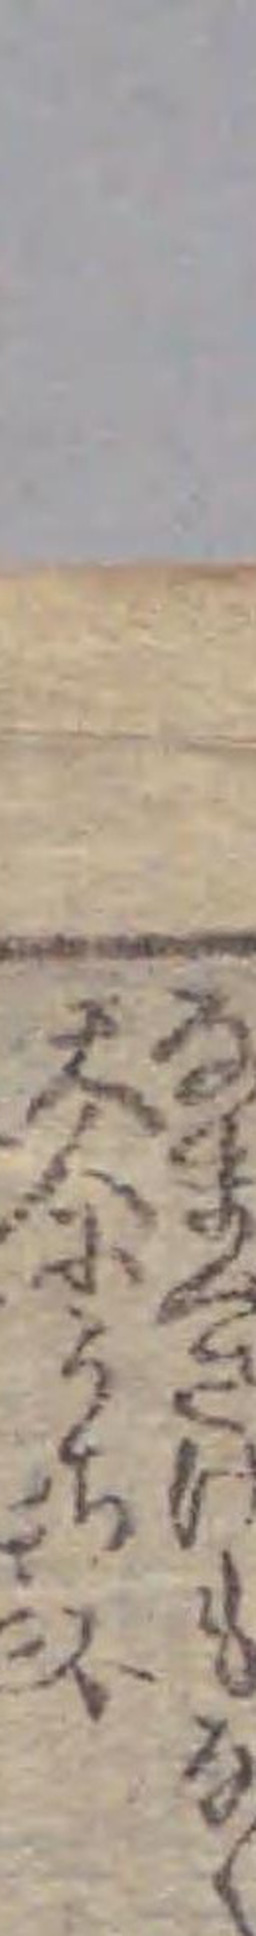天人にうち
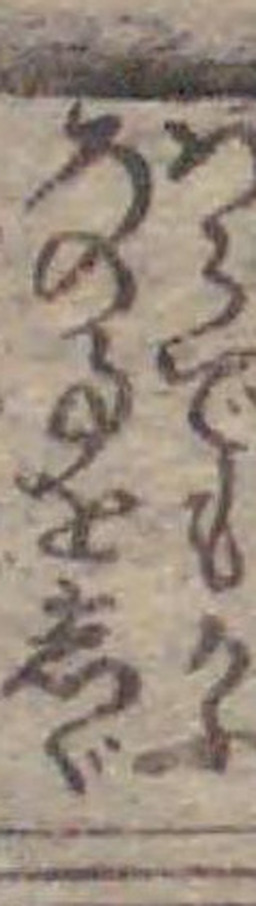ろの事をしゞ
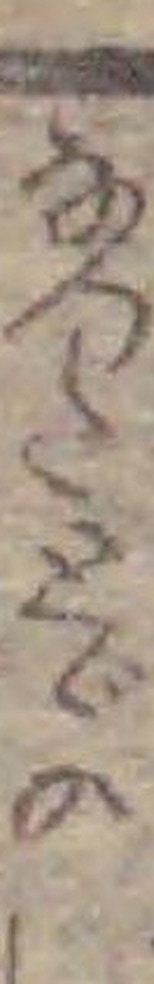なつたとゞの
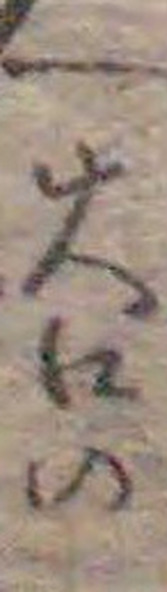大口の
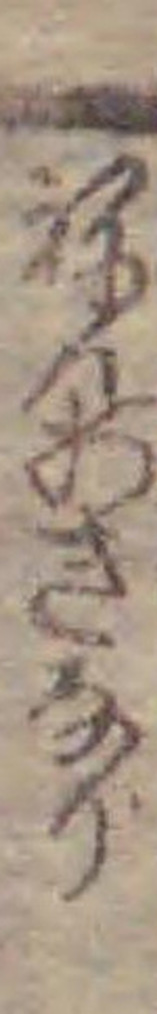ねんきあきなり
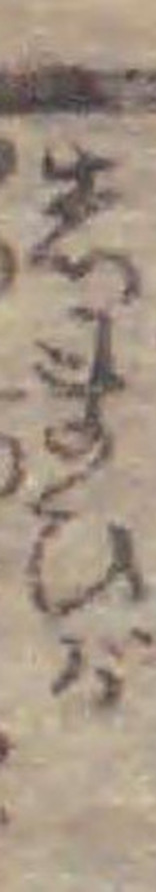しまひが

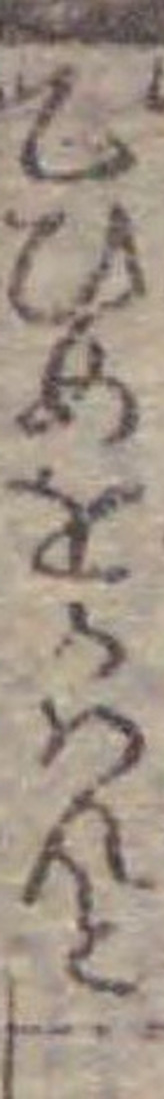乙ひめをかはんと
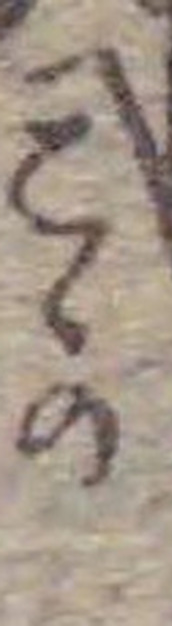〽こゝの
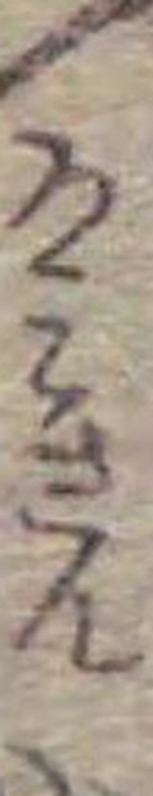かみさん
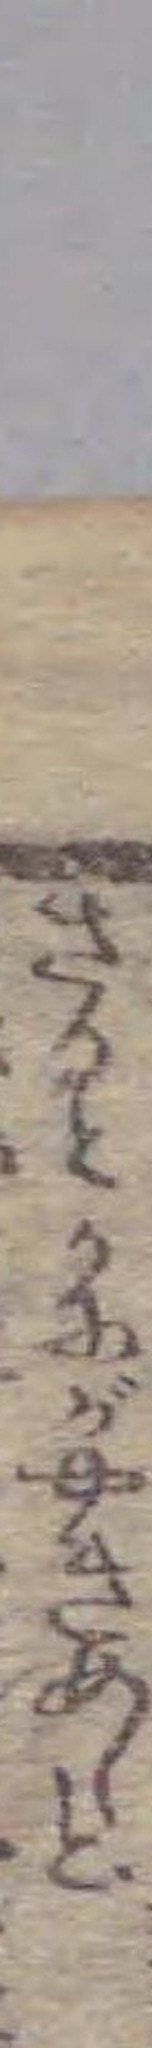さるとかにがやきめしと
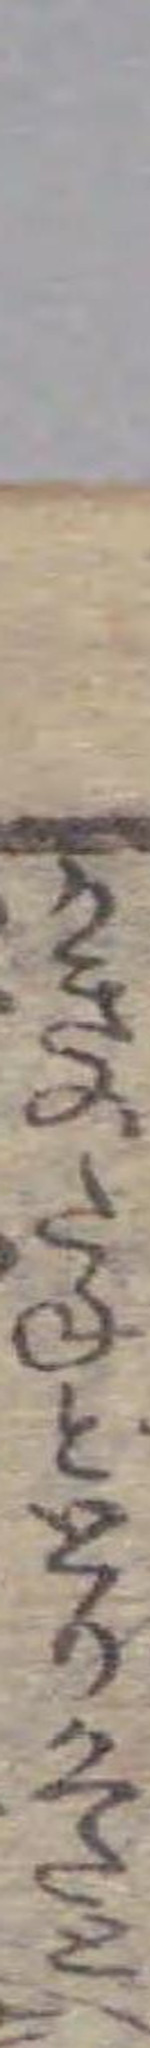かきのたねととりかへたと
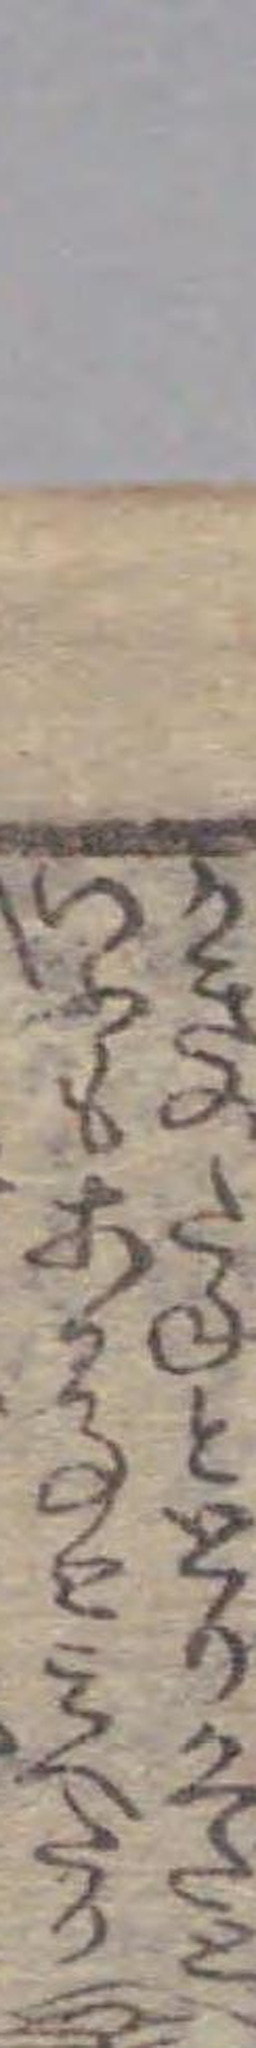いふもある事とみへたり
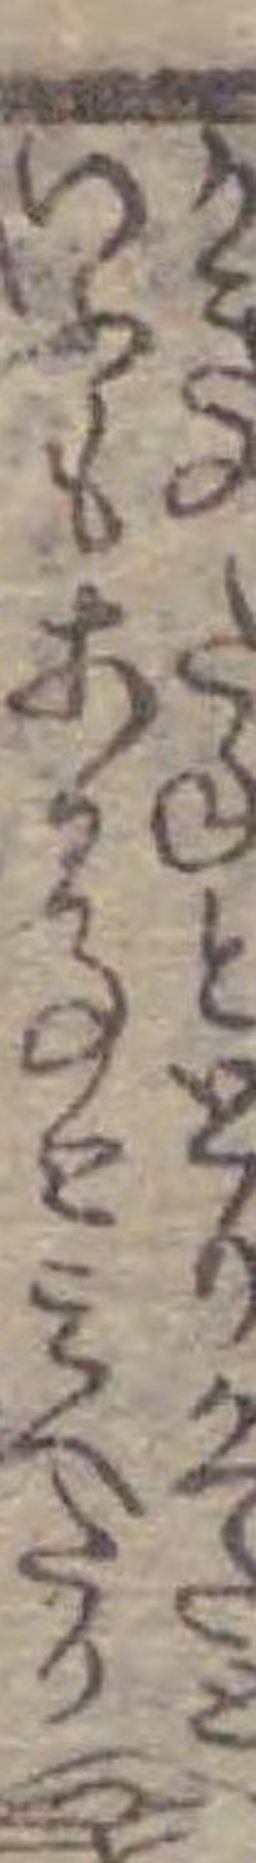いふもある事とみへたり
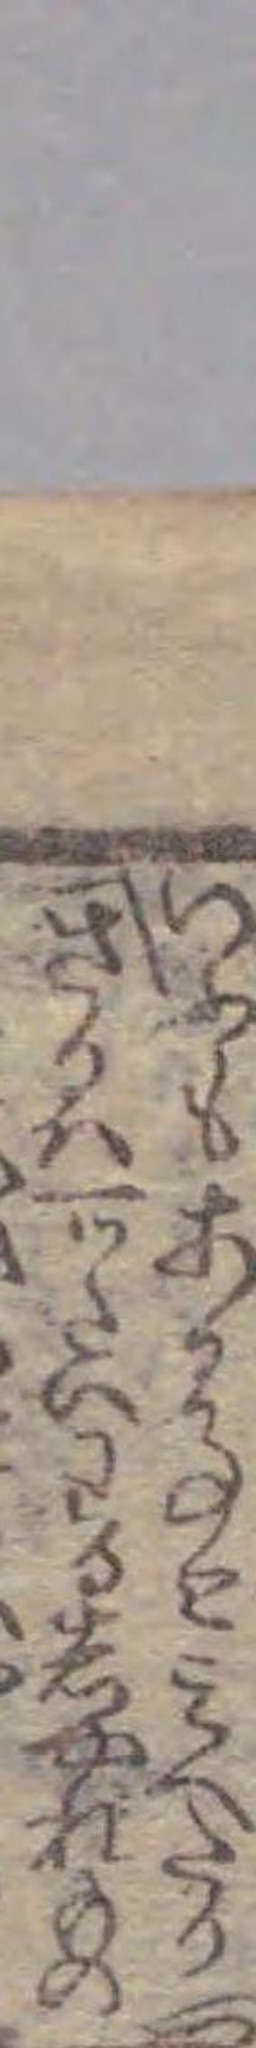〽さるは一
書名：竜宮苦界玉手箱 : 3巻
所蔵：国立国会図書館 National Diet Library, JAPAN
